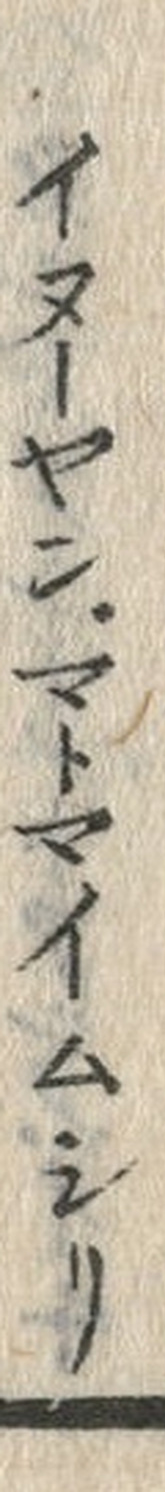イヌーヤン。マトマイムシリ
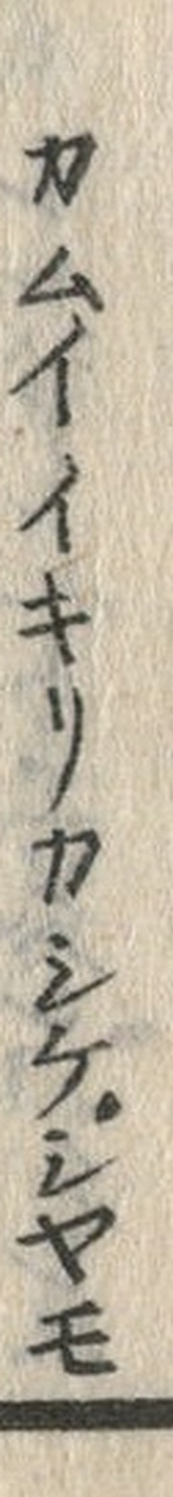カムイイキリカシケ。シヤモ
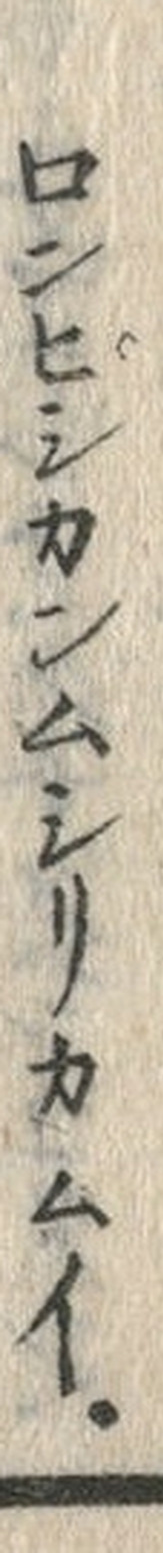ロンピシカンムシリカムイ。
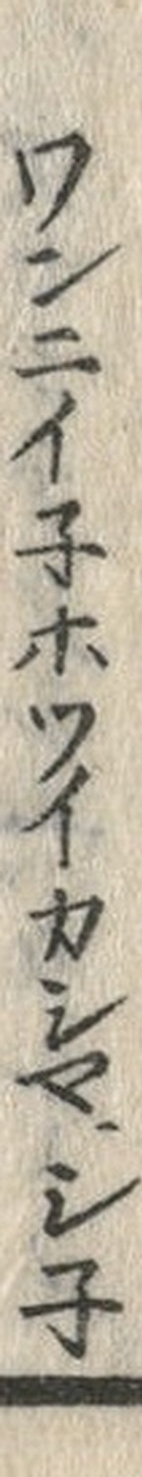ワンニイネホツイカシマシネ
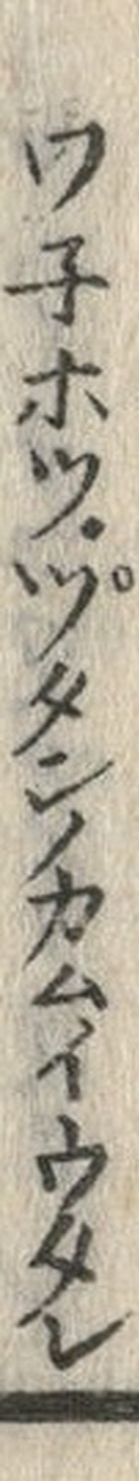ワネホツ。ツ゚タンノカムイウタレ
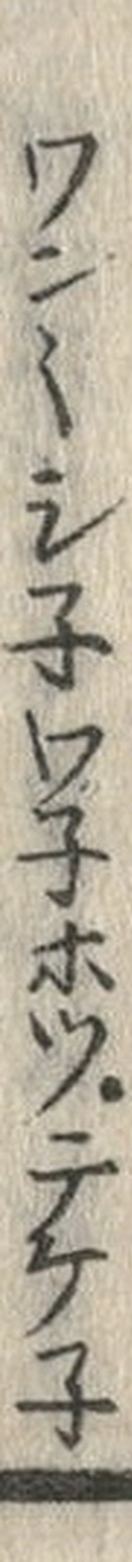ワン〳〵シネワネホツ。テケネ

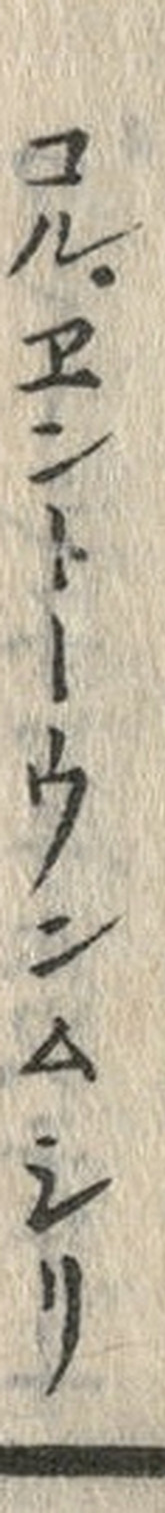コル。ヱントーウンムシリ
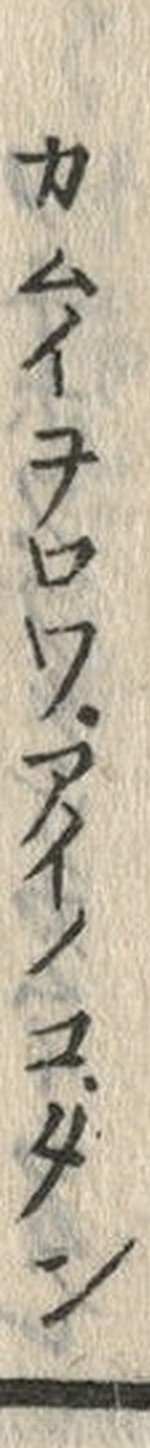カムイヲロワ。アイノコタン
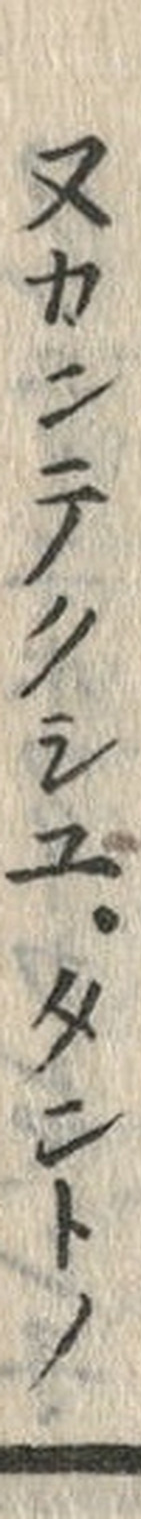ヌカンテクシユ。タントノ
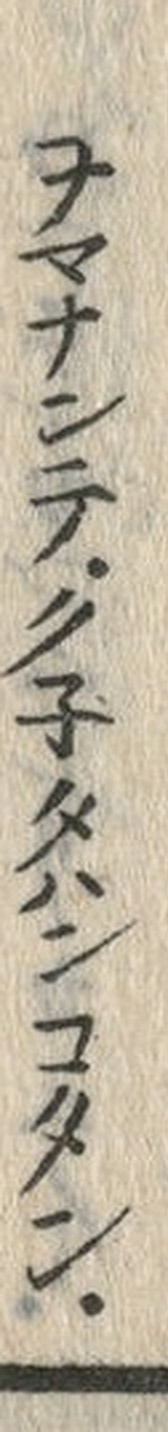ヲマナンテ。クネタハンコタン。
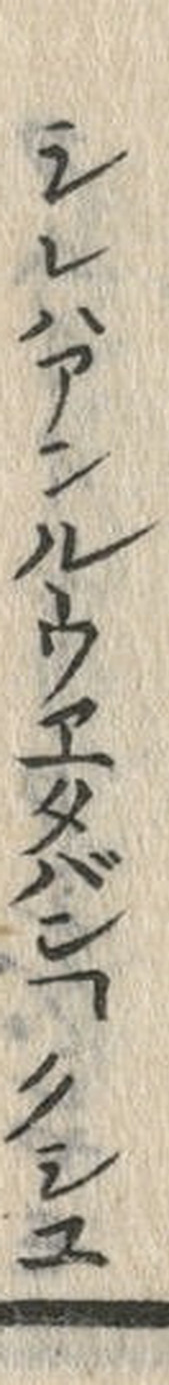シレハアンルウヱタバン「クシユ
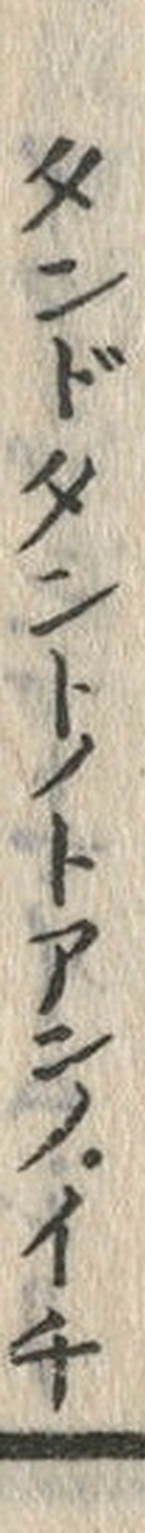タンドタントノトアンノ。イチ
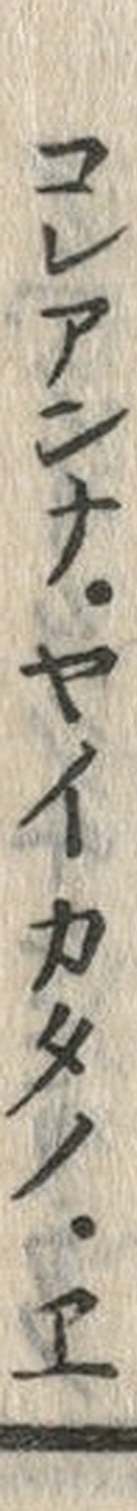コレアンナ。ヤイカタノ。ヱ
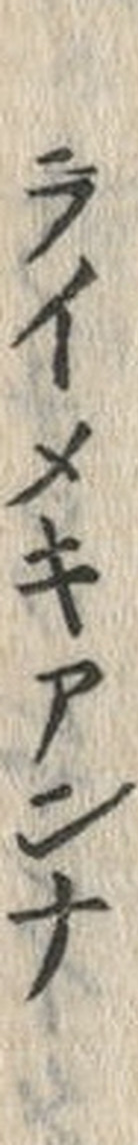ライメキアンナ
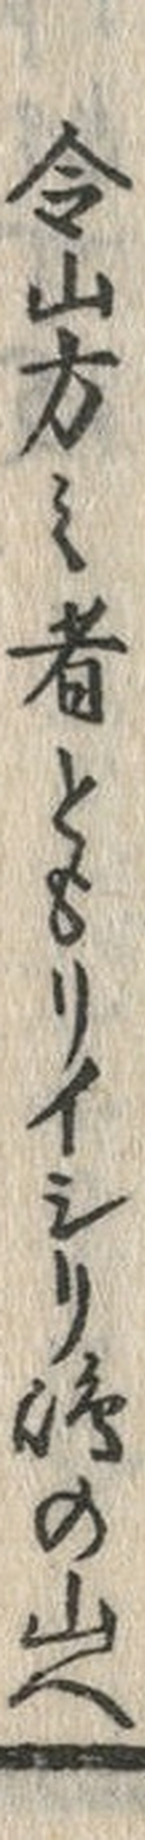令山方之者ともリイシリ嶋の山へ
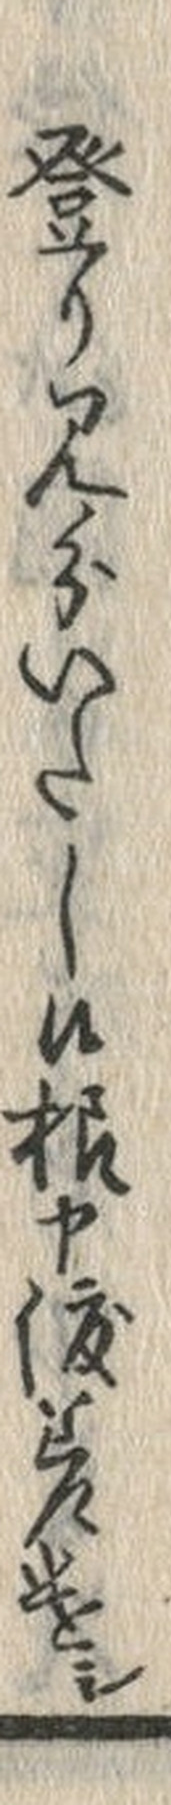登り見分いたし候様申渡差遣シ
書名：蝦夷方言藻汐草　坤巻
